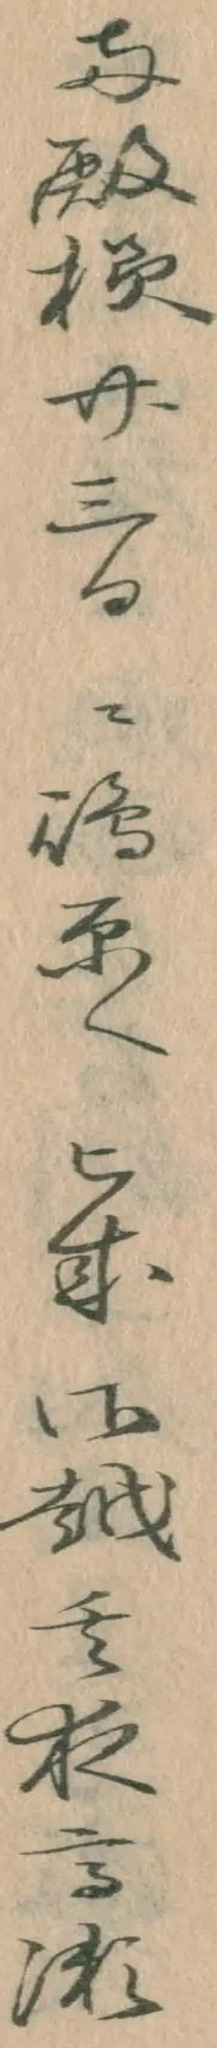両殿様廿三日に島原へ被成御越其夜高瀬
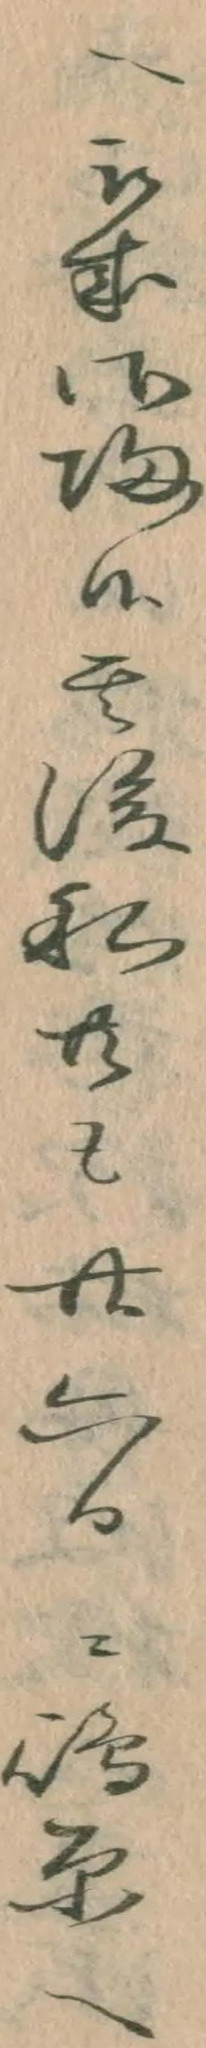へ被成御帰候其後私共も廿六日に島原へ
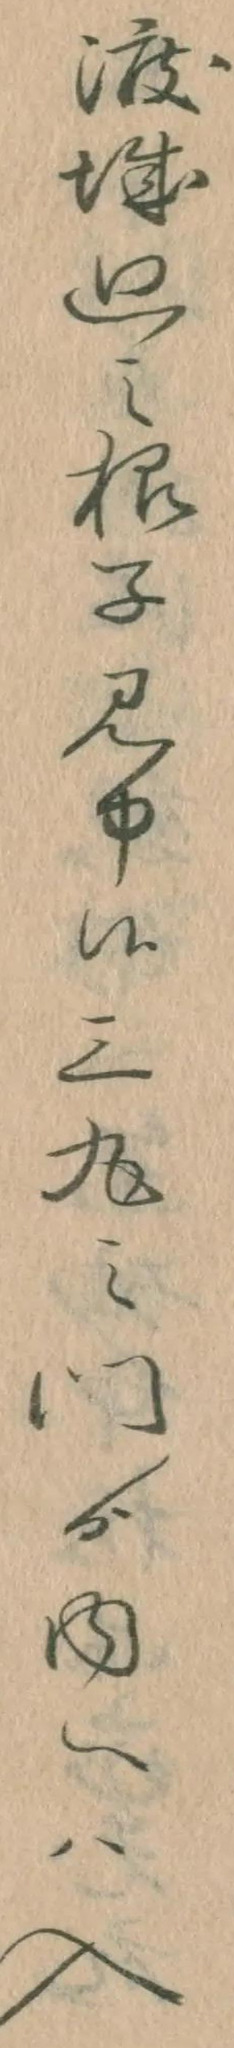渡城廻之様子見申候三丸之門ゟ内へは入
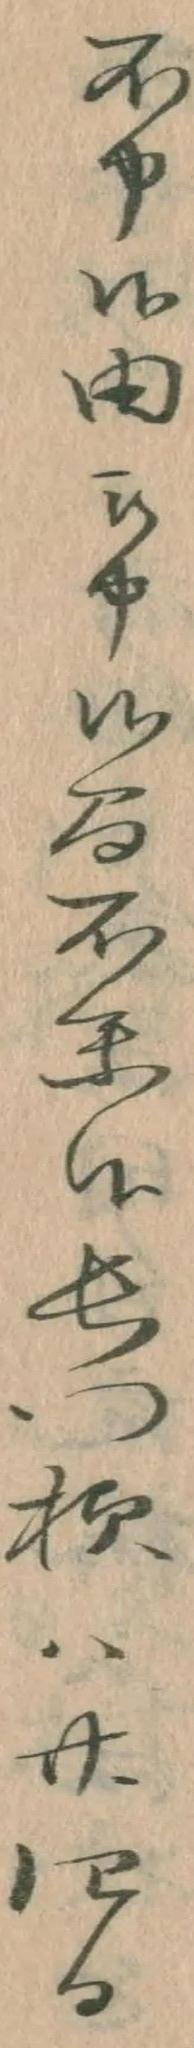不申候由被申候間不参候長門様は廿四日
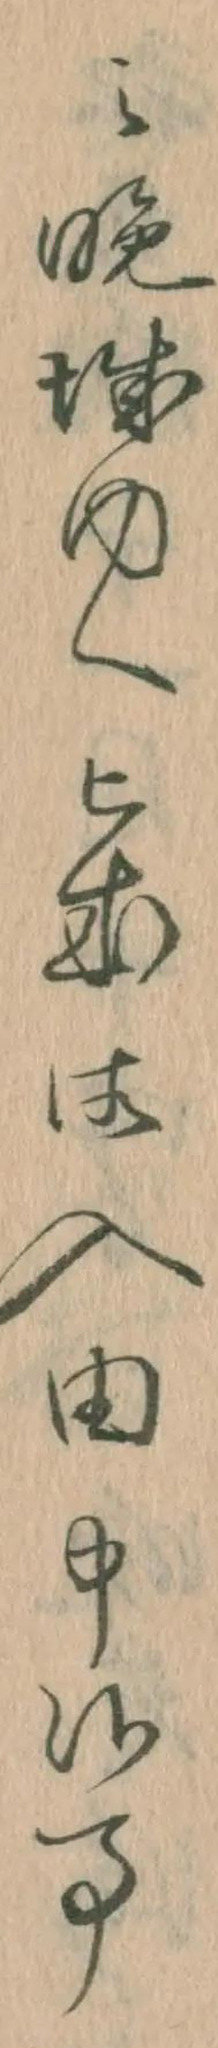之晩城内へ被成御入由申候事
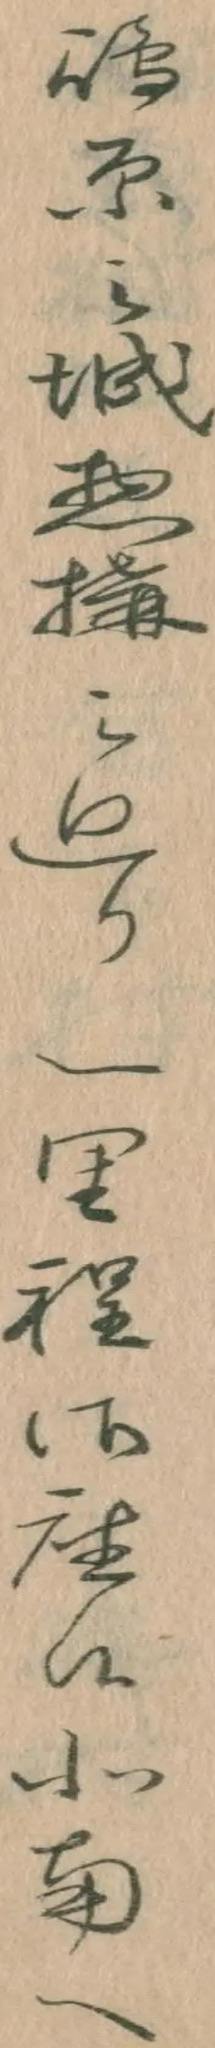一島原之城惣構之廻り一里程御座候北南へ
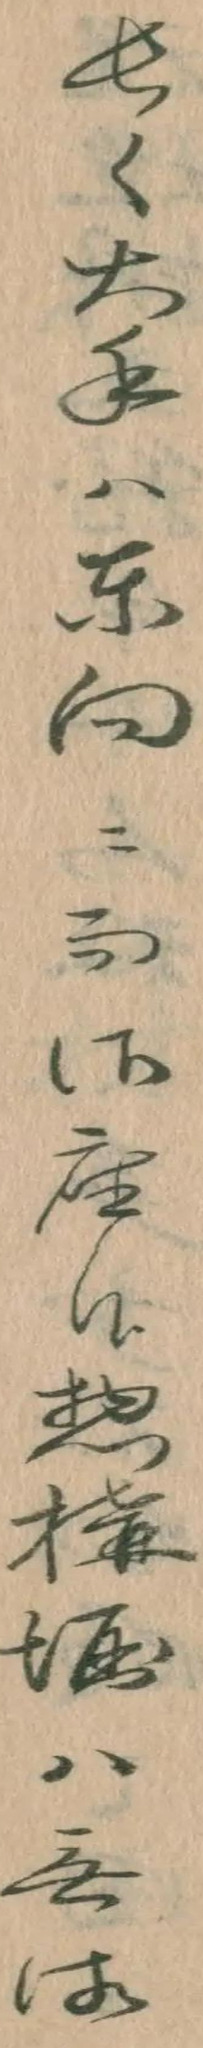長く大手は東向に而御座候惣構堀は無御
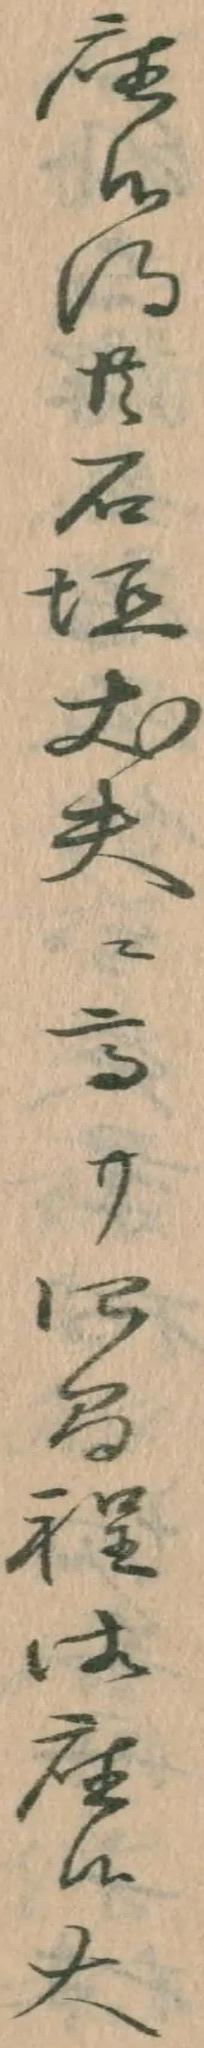座候得共石垣丈夫に高さ四間程御座候大
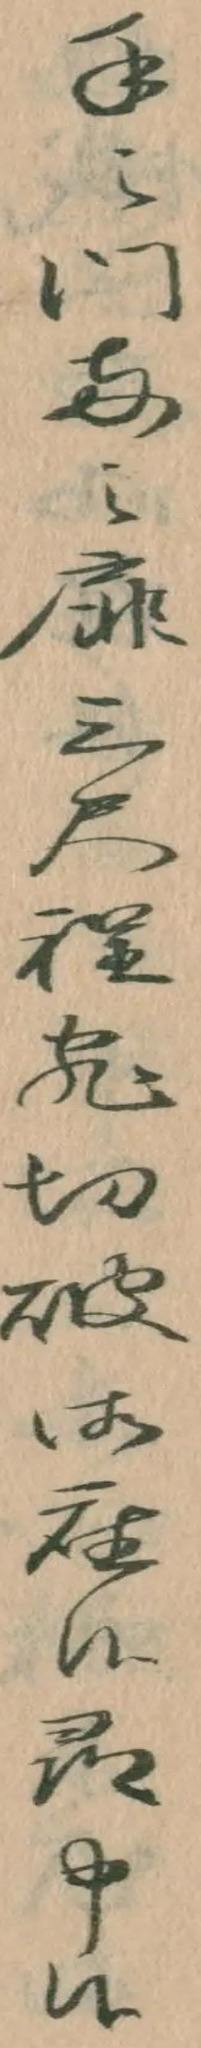手之門両之扉三尺程究切破御座候尋申候
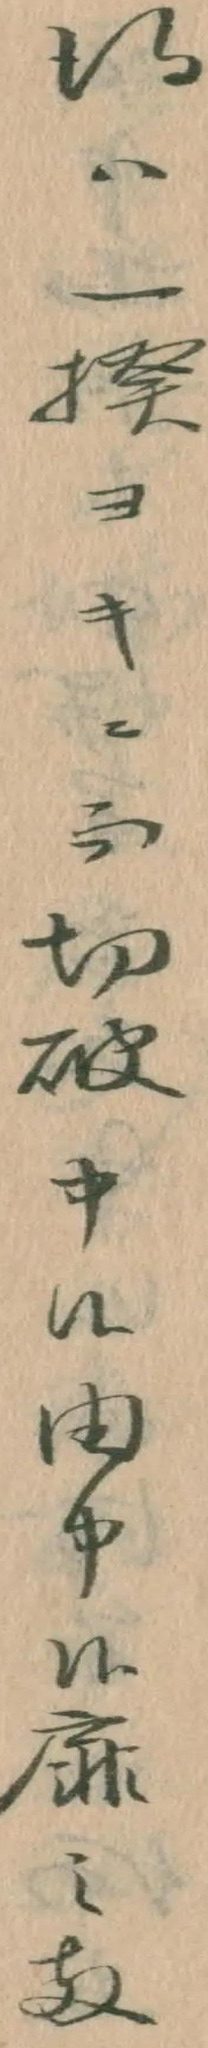得は一揆よきに而切破申候由申候扉之両
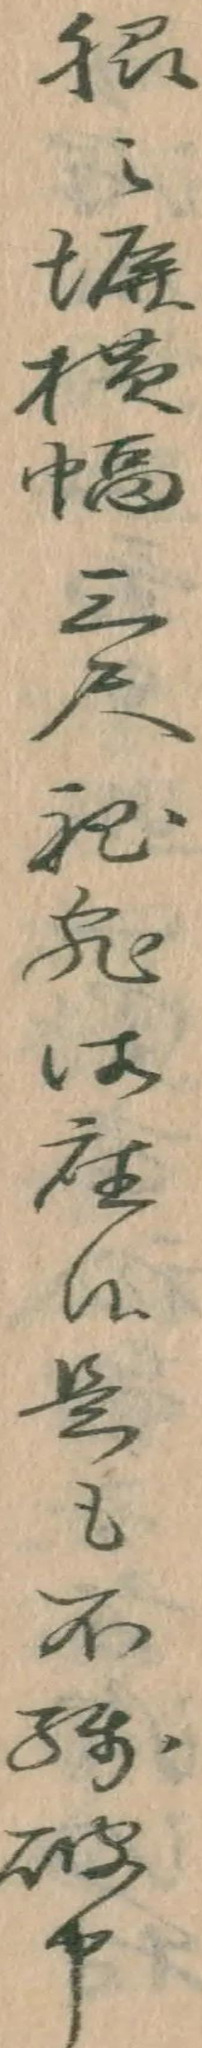脇之塀横幅三尺程究御座候是も不残破申
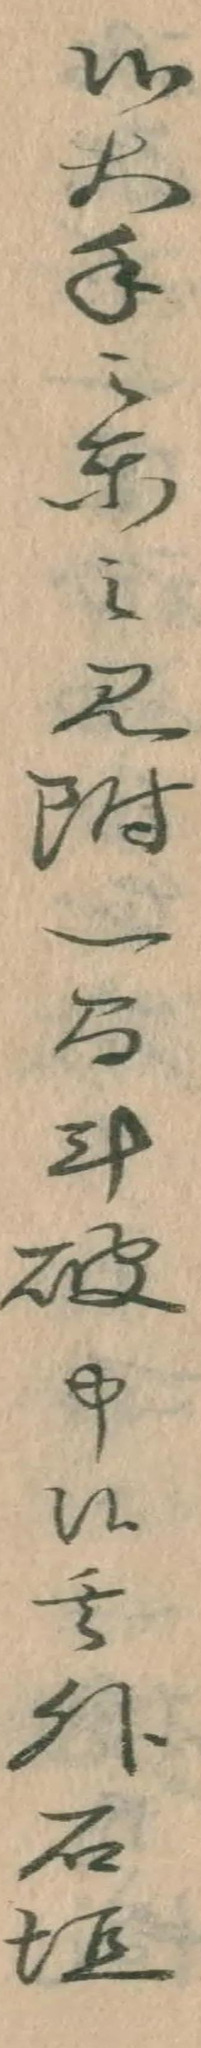候大手之東之見附一間斗破申候其外石垣
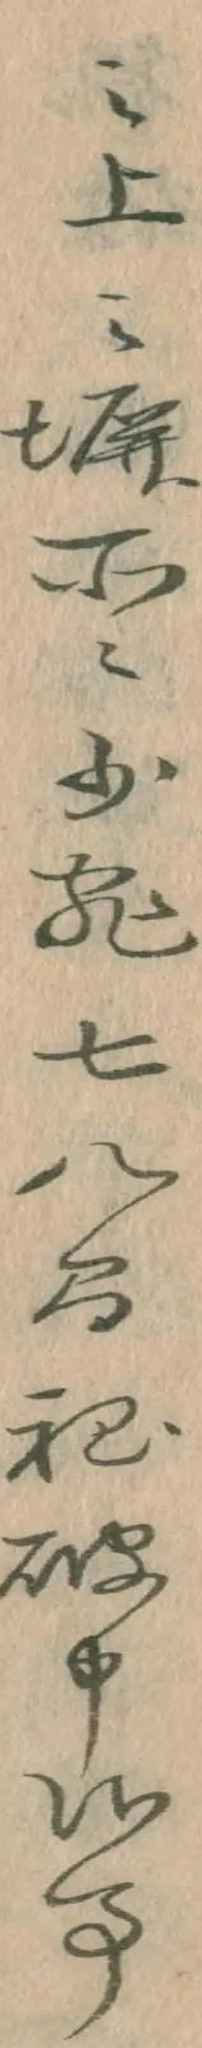之上之塀所に少究七八間程破申候事
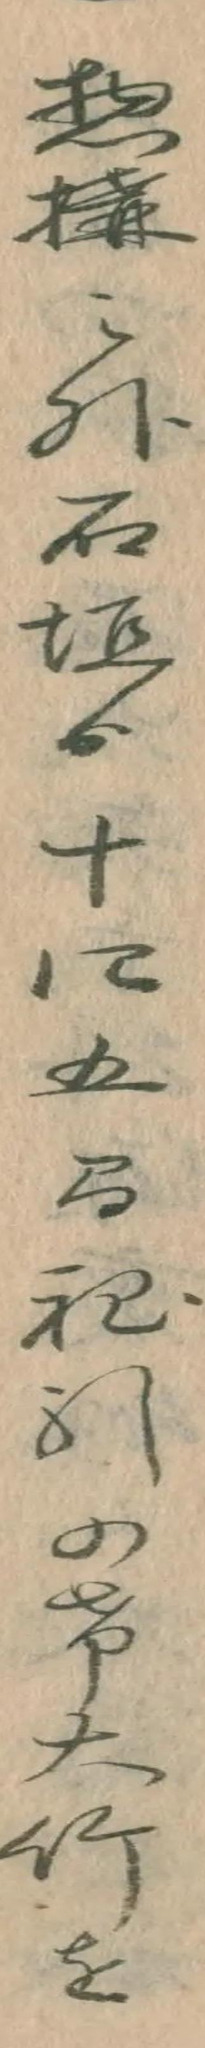一惣構之外石垣ゟ十四五間程引の希大竹を
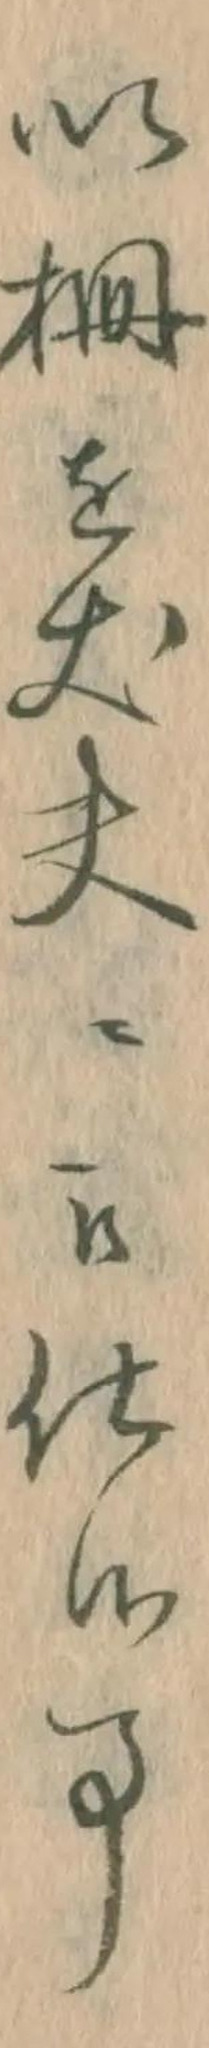以柵を丈夫に被仕候事
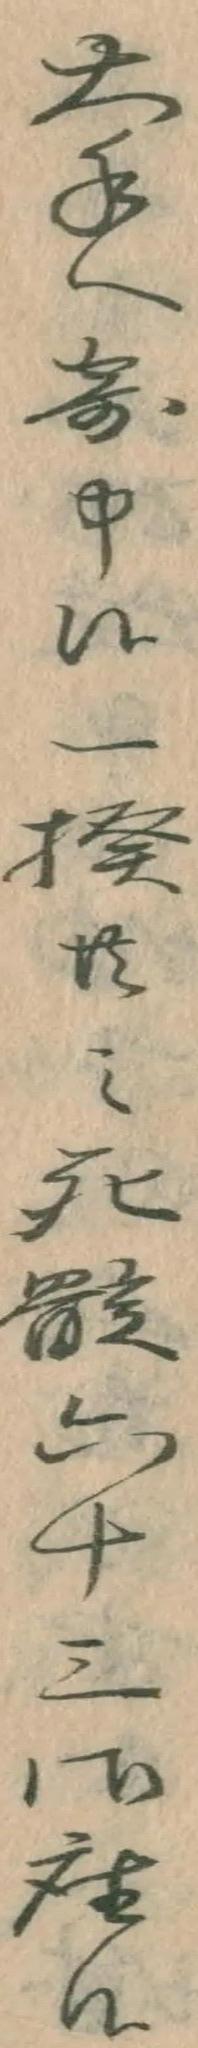一大手へ寄申候一揆共之死骸六十三御座候
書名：切支丹御退治記 49巻. [4]
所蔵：国立国会図書館 National Diet Library, JAPAN
